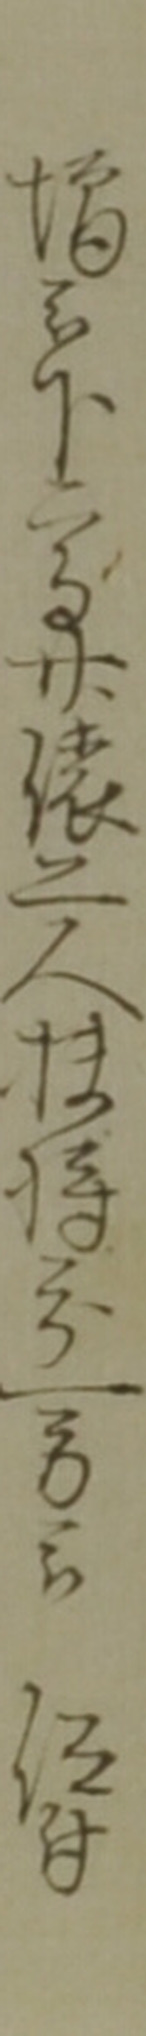増被下高廿俵二人扶持分一方被仰付
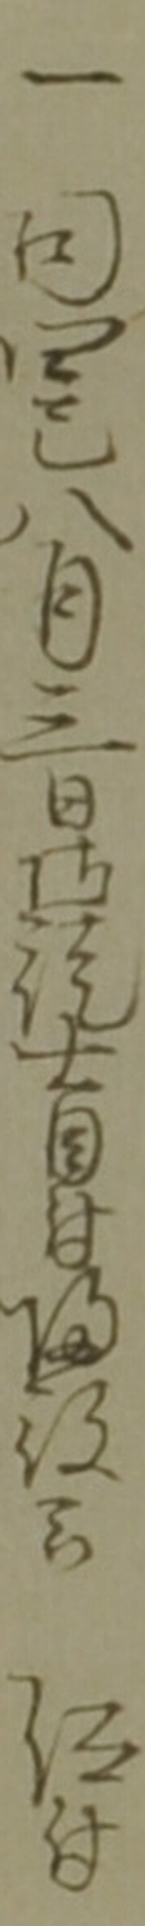一同四巳八月三日御徒士目付帰役被仰付
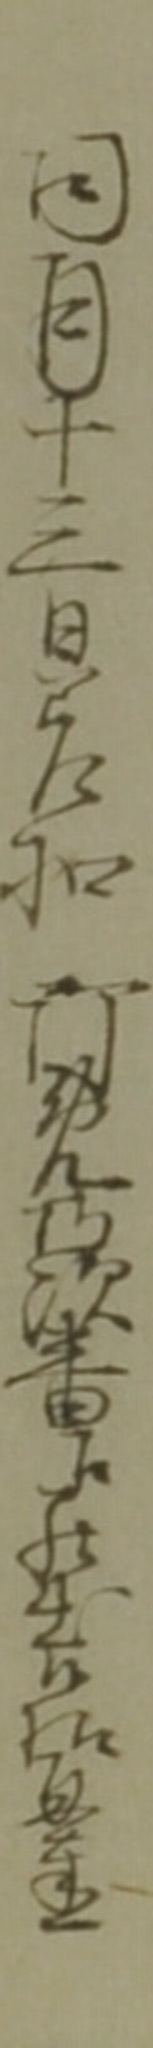同月十三日差控御免御次番江罷出候様通達
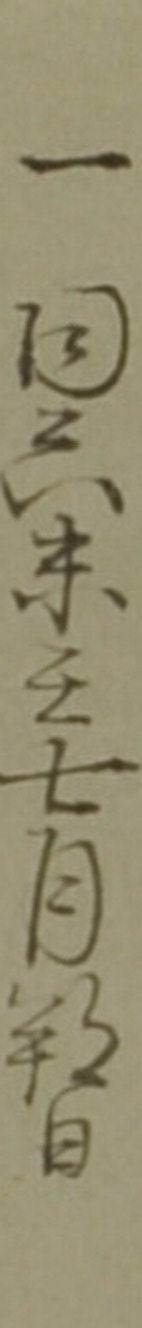一同六未壬七月朔日
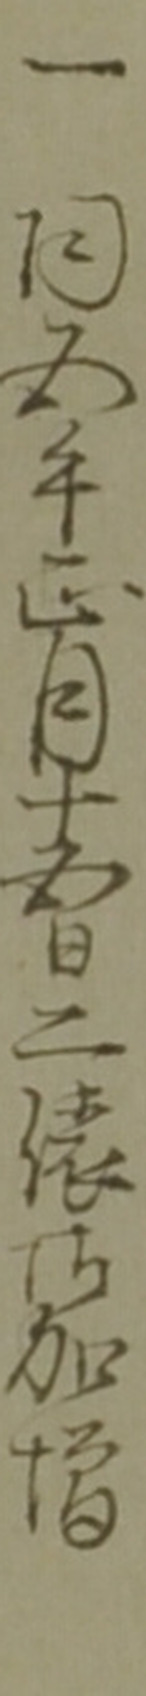一同五午正月十五日二俵御加増
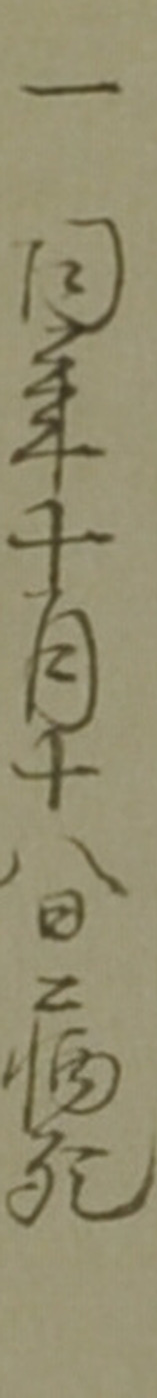一同年十月十八日病死
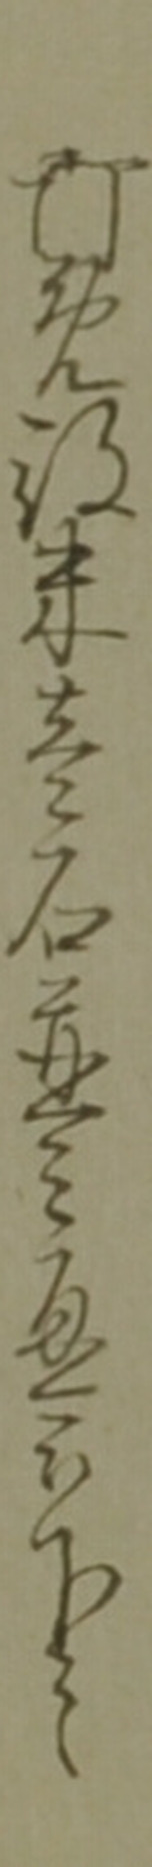御免役来壱石並之通被下之
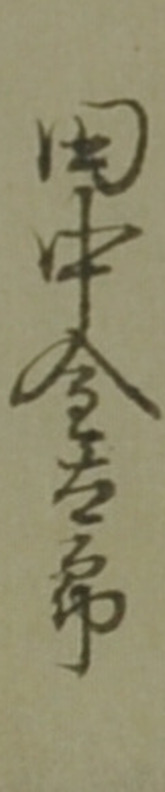田中金吉郎
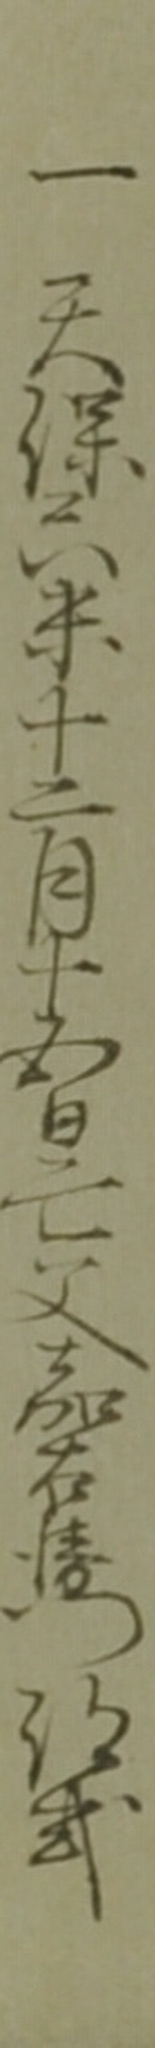一天保六年十二月十五日亡父嘉右衛門跡式
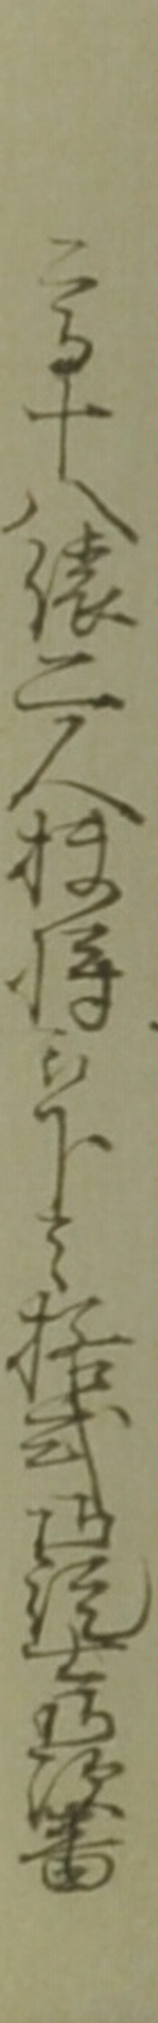高十八俵二人扶持被下之格式御徒士御次番

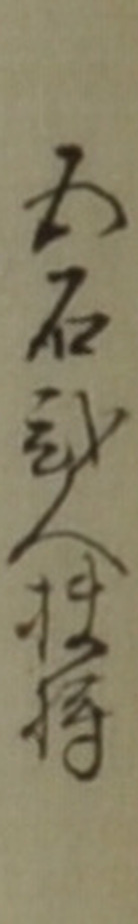五石弐人扶持
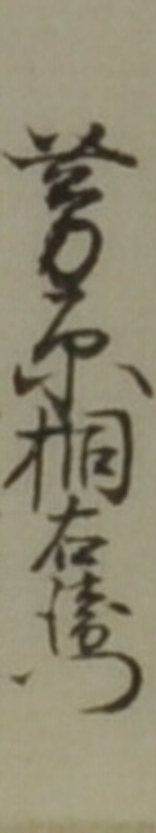芳原桐右衛門
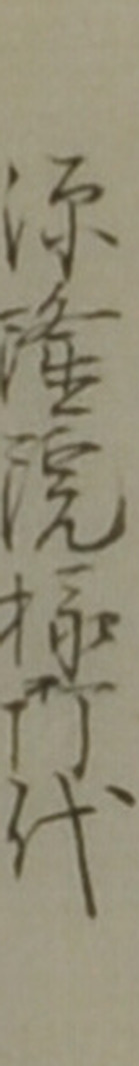源隆院樣御代
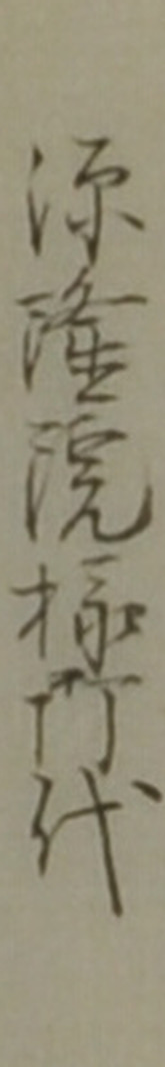源隆院樣御代
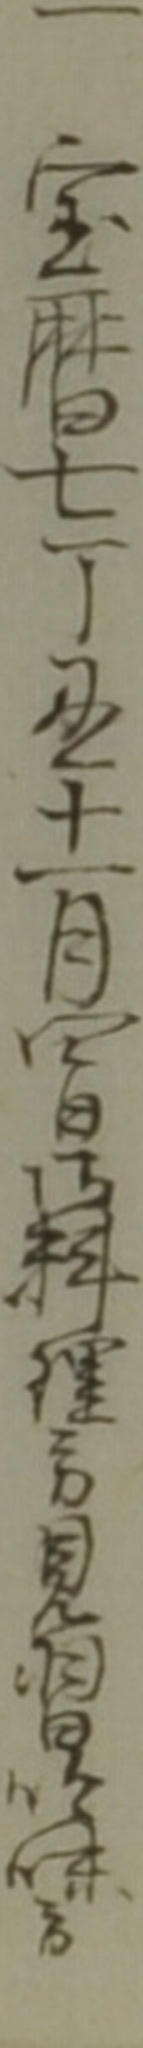一宝暦七丁丑十一月四日御料理方見習吟味方
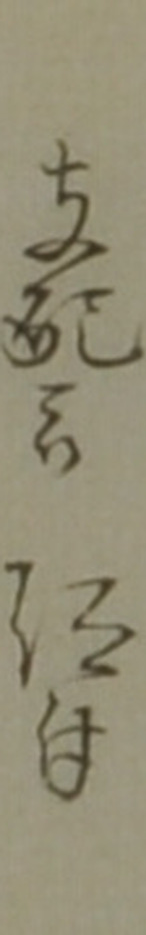支配被仰付
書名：無足諸士勤仕録（五）
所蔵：伊那市立高遠町図書館・合同会社AMANE
